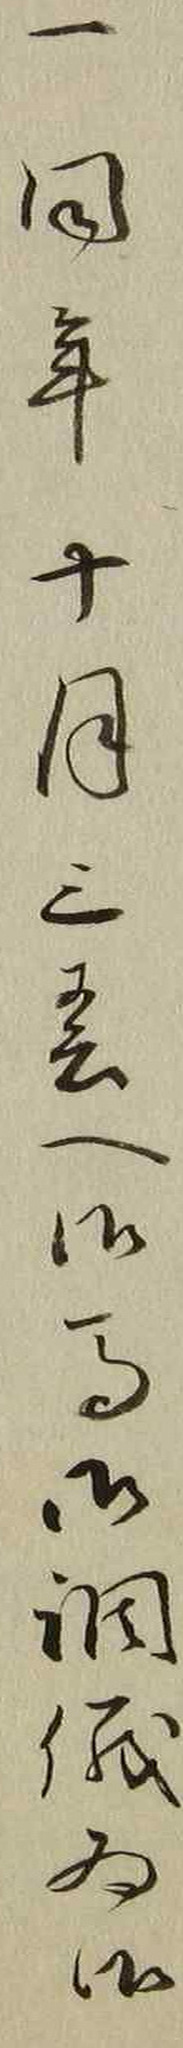一同年十月三春へ御馬御調儀為御
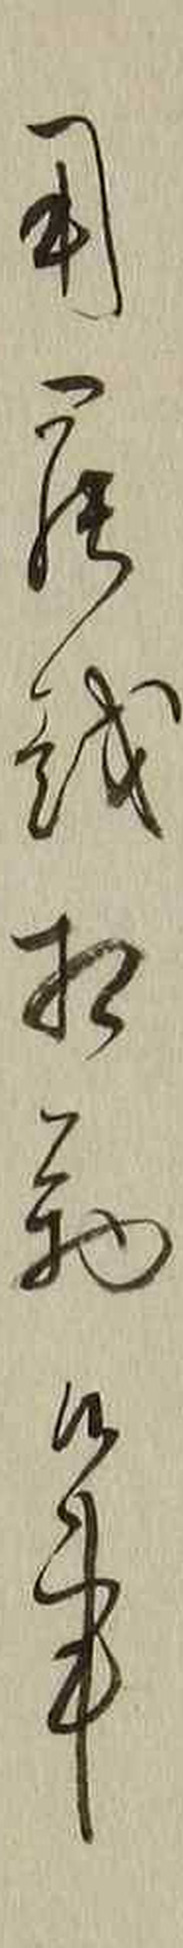用罷越相勤候事
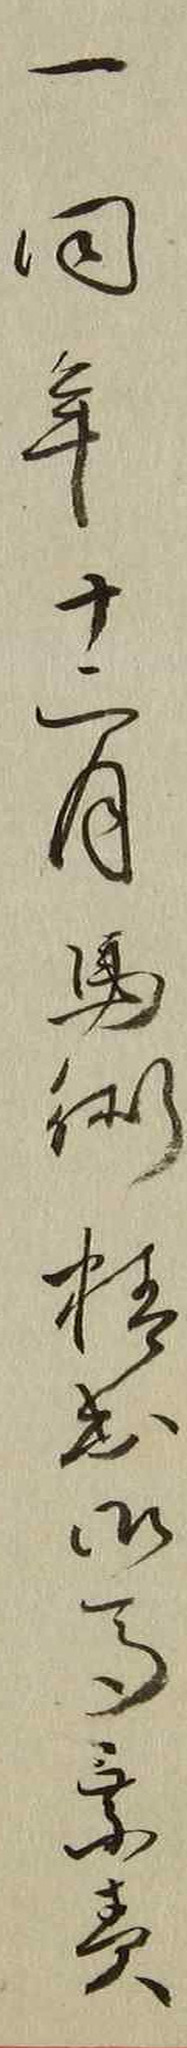一同年十二月馬術精出御馬乗責
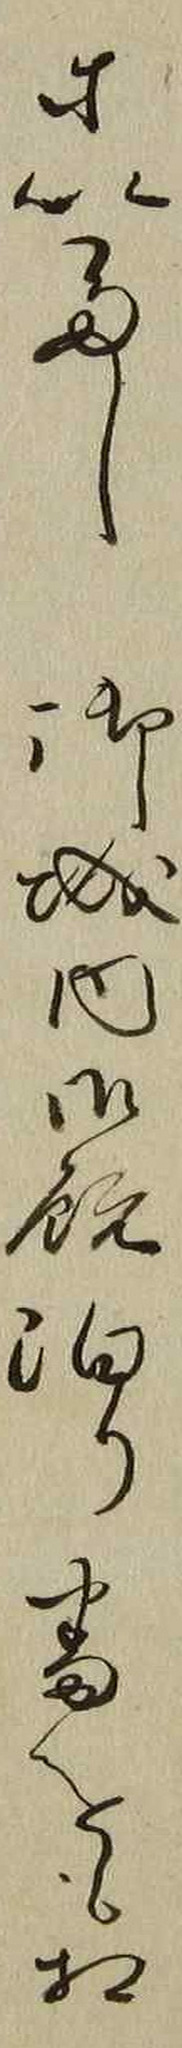等いたし御城内御厩泊り番をも相
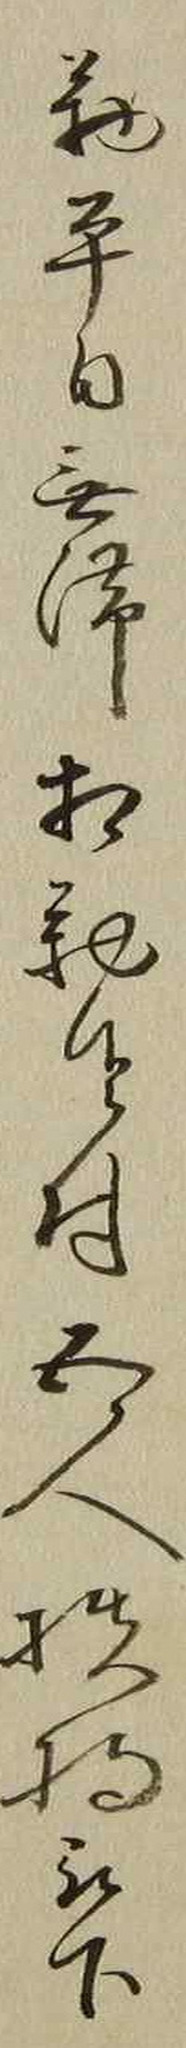勤平日無滞相勤候ニ付五人扶持被下
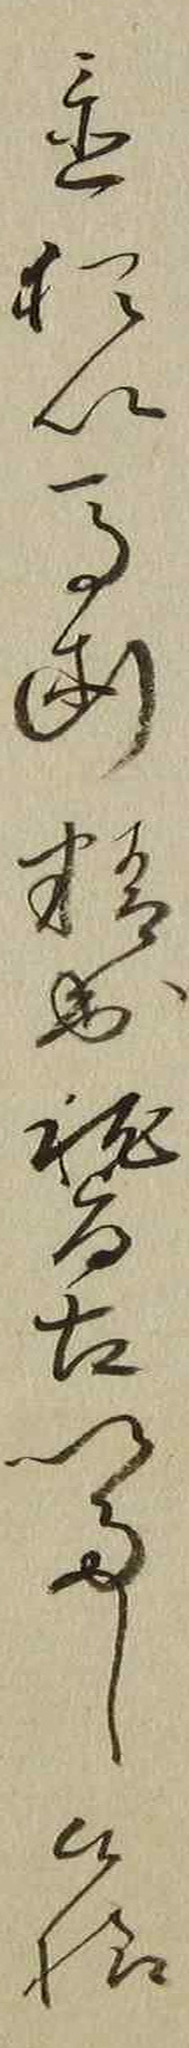置猶以馬術精出稽古いたし把候様
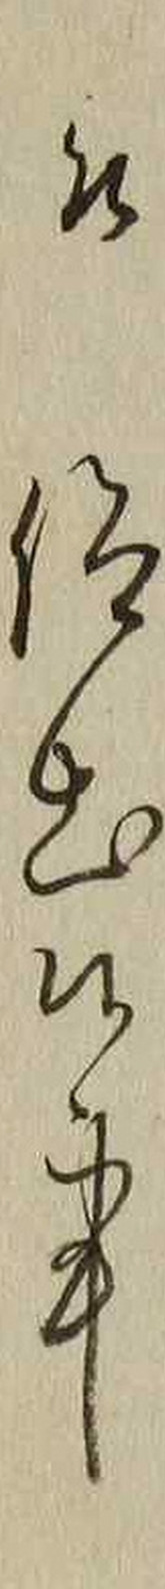被仰出候事
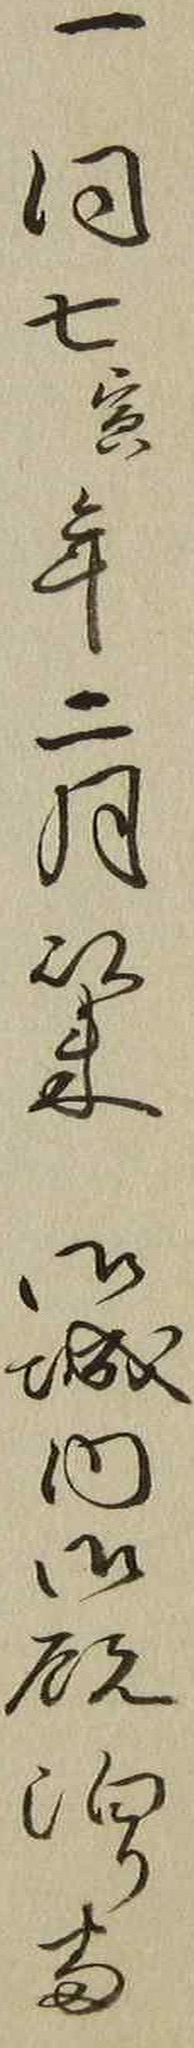一同七寅年二月以来御城内御厩泊り番
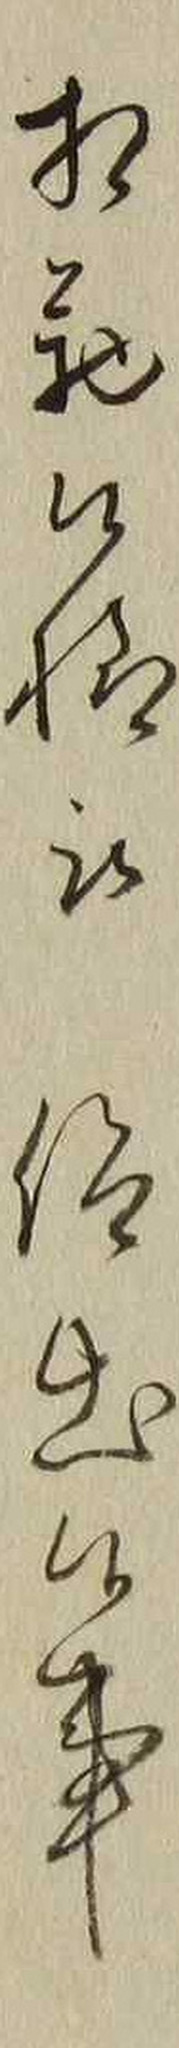相勤候様被仰出候事
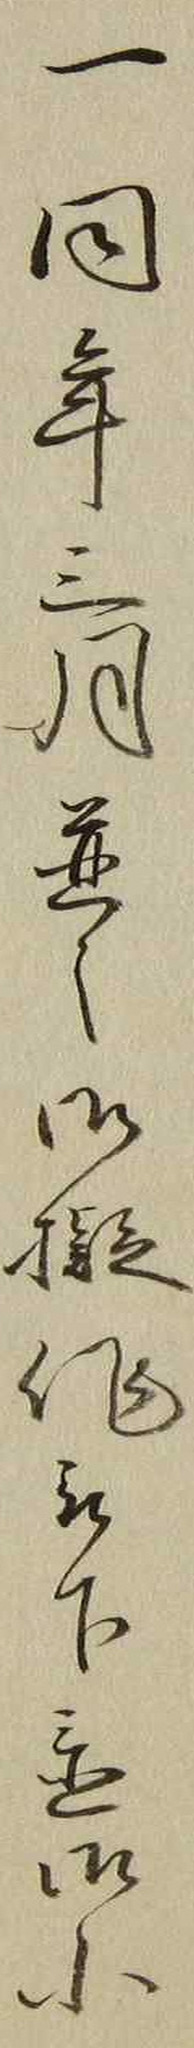一同年三月並之御擬作被下置御小
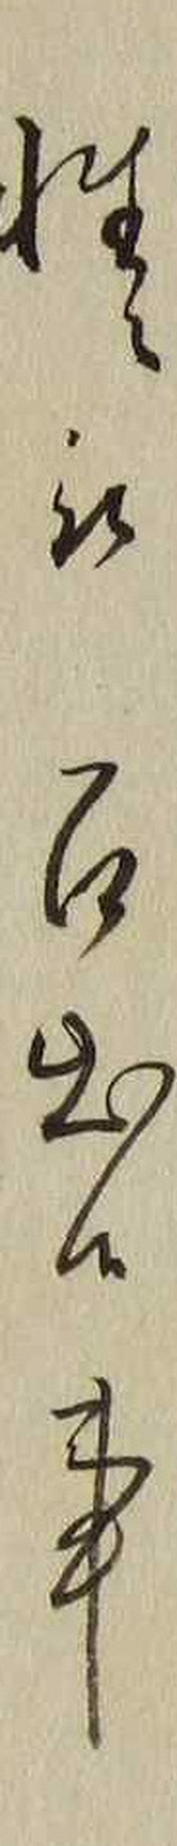性ニ被召出候事
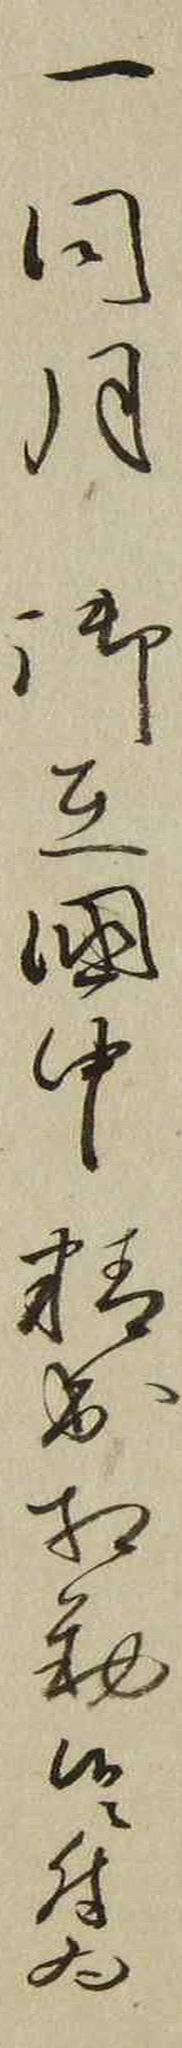一同月御在国中精出相勤候ニ付為
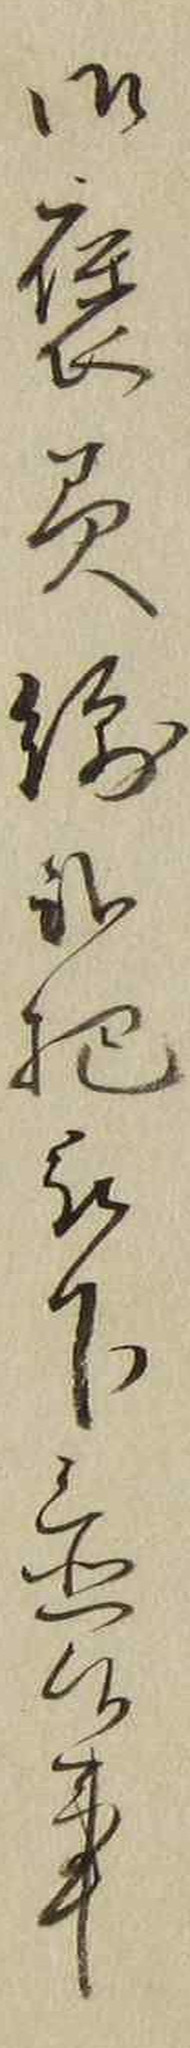御褒美綿弐把被下置候事

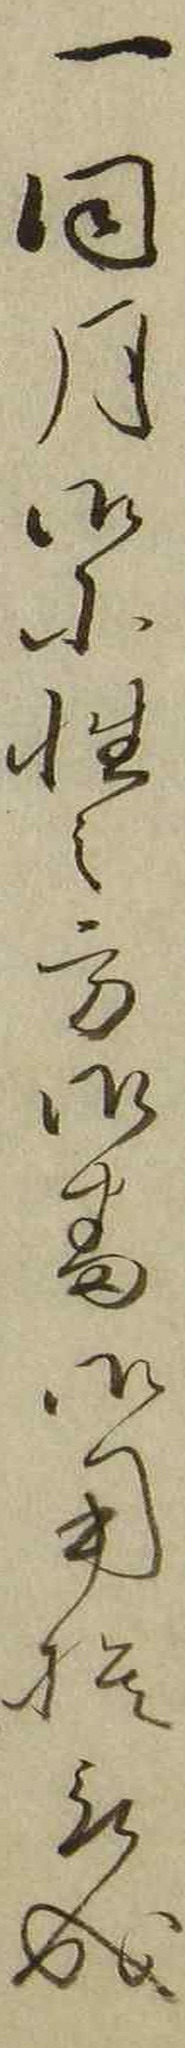一同月御小性之方御番御用捨被成
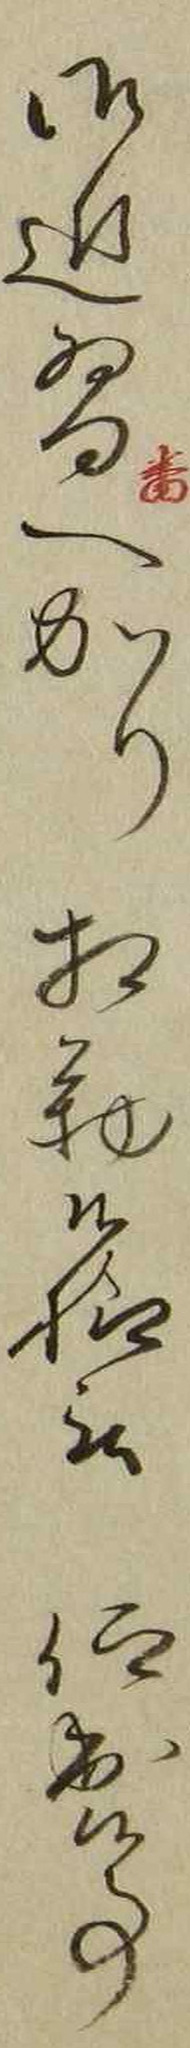御近習へ加り相勤候様被仰出候事
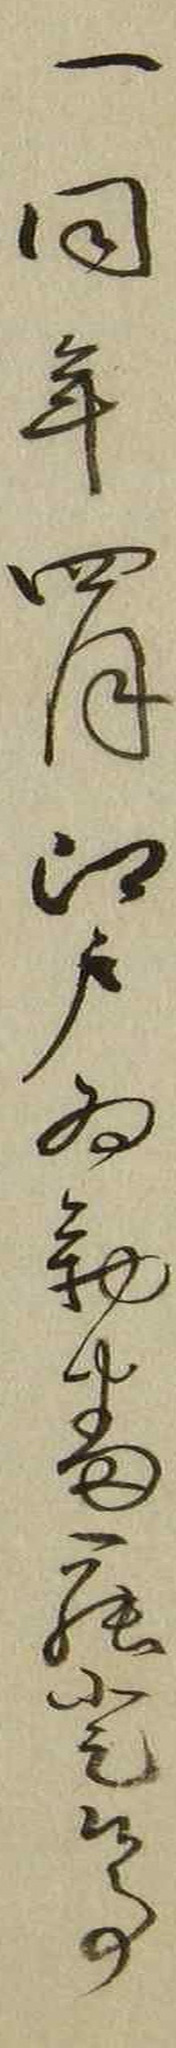一同年四月江戸為勤番罷登候事
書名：諸士系譜　巻之3　い之部3
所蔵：会津若松市立会津図書館
